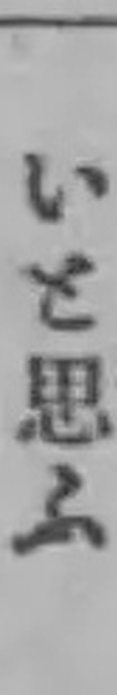いと思ふ
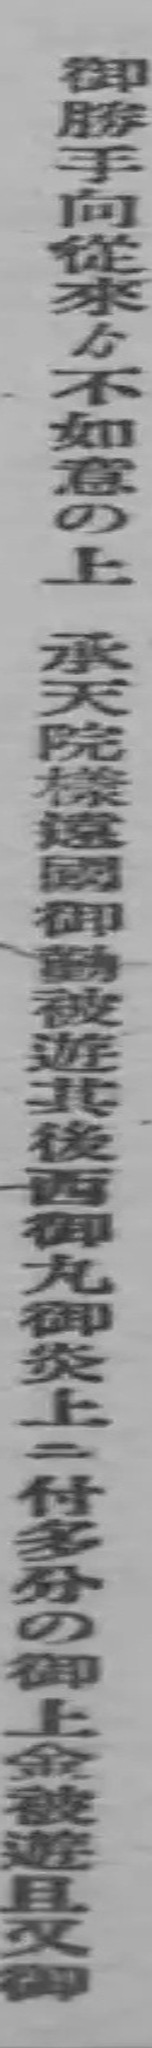御勝手向従来ゟ不如意の上承天院様遠国御勤被遊其後西御丸御炎上ニ付多分の御上金被遊且又御
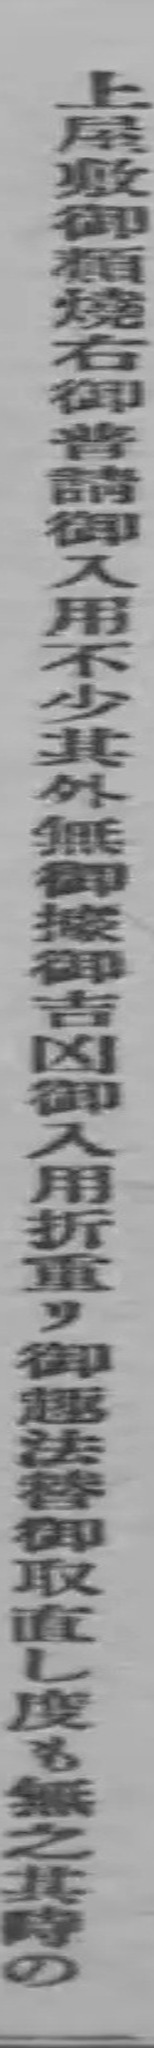上屋敷御類焼右御普請御入用不少其外無御拠御吉凶御入用折重リ御趣法替御取直し度も無之其時の
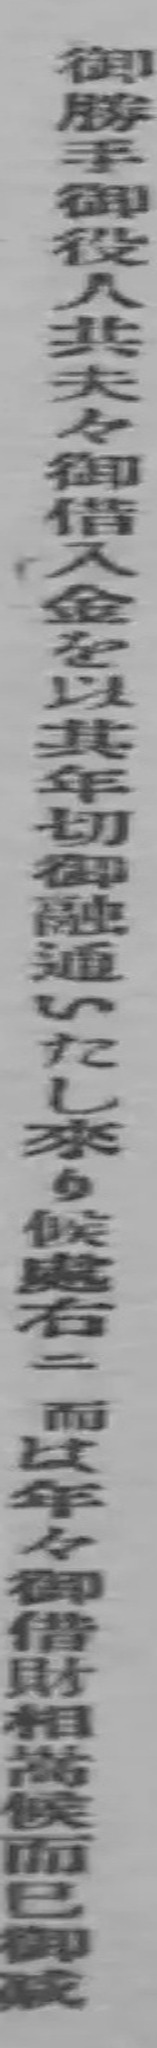御勝手御役人共夫々御借入金を以其年切御融通いたし来り候処右ニ而は年々御借財相嵩候而巳御減
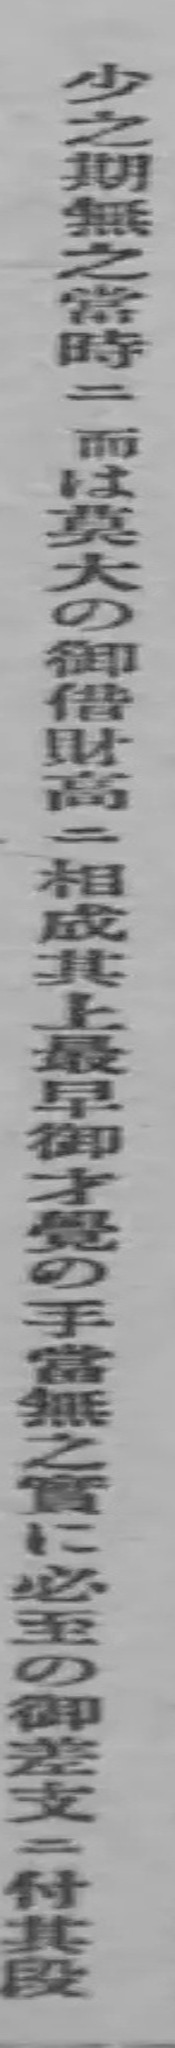少之期無之当時ニ而は莫大の御借財高ニ相成其上最早御才覚の手当無之実に必至の御差支ニ付其段
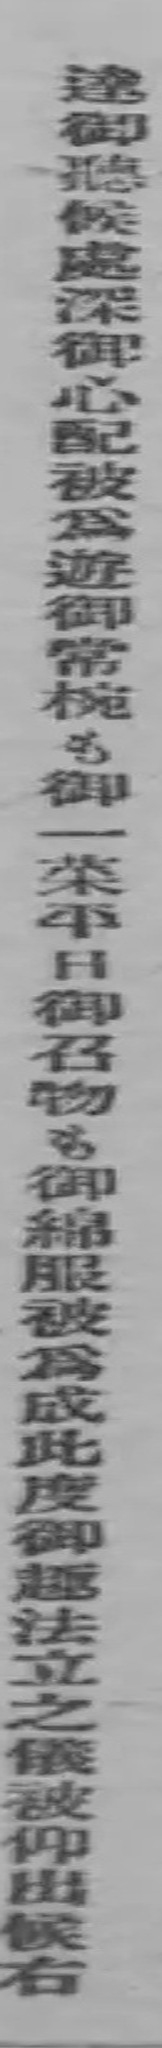達御聴候処深御心配被為遊御常椀も御一菜平日御召物も御綿服被為成此度御趣法立之儀被仰出候右
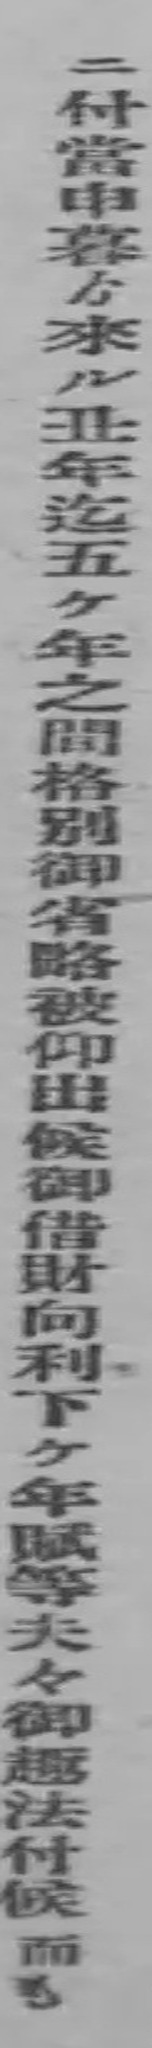ニ付当申暮ゟ来ル丑年迄五ヶ年之間格別御省略被仰出候御借財向利下ケ年賦等夫々御趣法付候而も
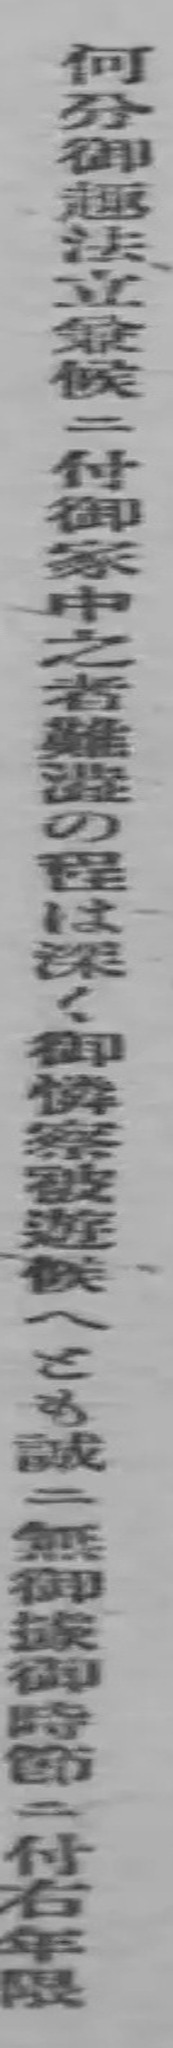何分御趣法立兼候ニ付御家中之者難渋の程は深く御憐察被遊候へとも誠ニ無御拠御時節ニ付右年限
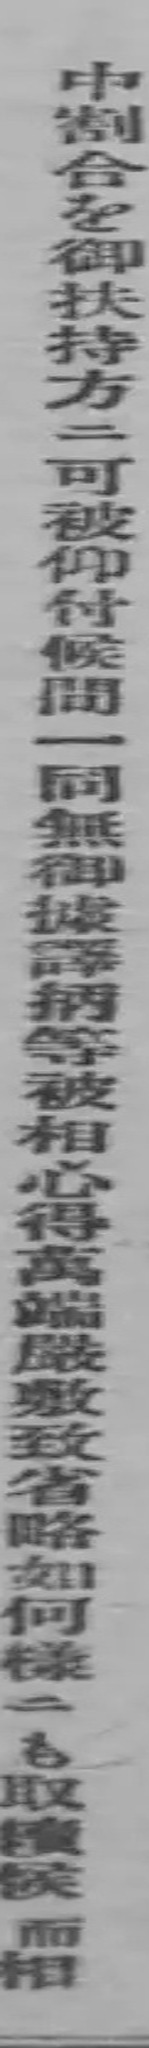中割合を御扶持方ニ可被仰付候間一同無御拠訳柄等被相心得万端厳敷致省略如何様ニも取続候而相
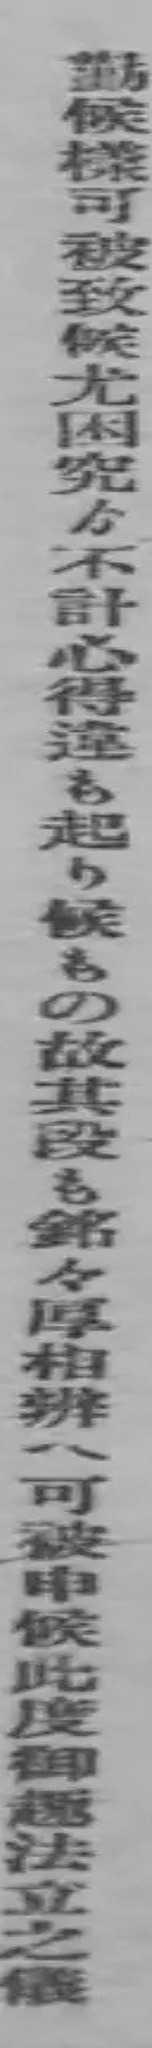勤候様可被致候尤困究ゟ不計心得違も起り候もの故其段も銘々厚相弁へ可被申候此度御趣法立之儀
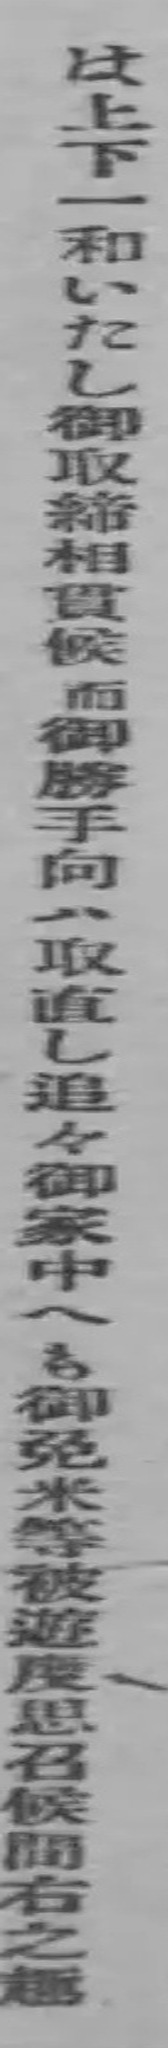は上下一和いたし御取締相貫候而御勝手向ハ取直し追々御家中へも御免米等被遊度思召候間右之趣
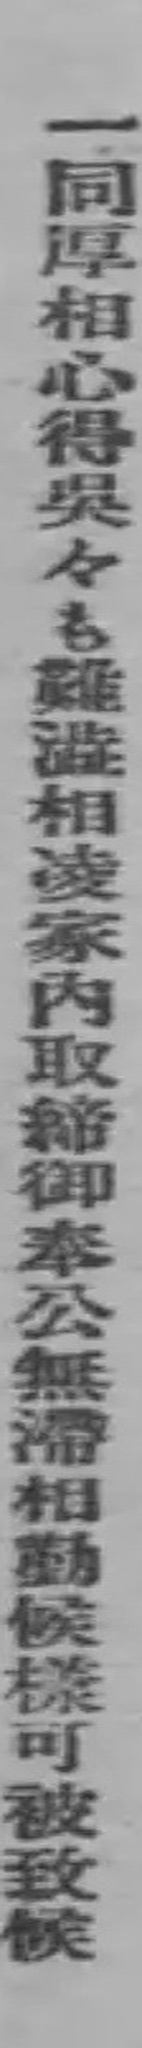一同厚相心得呉々も難渋相凌家内取締御奉公無滞相勤候様可被致候
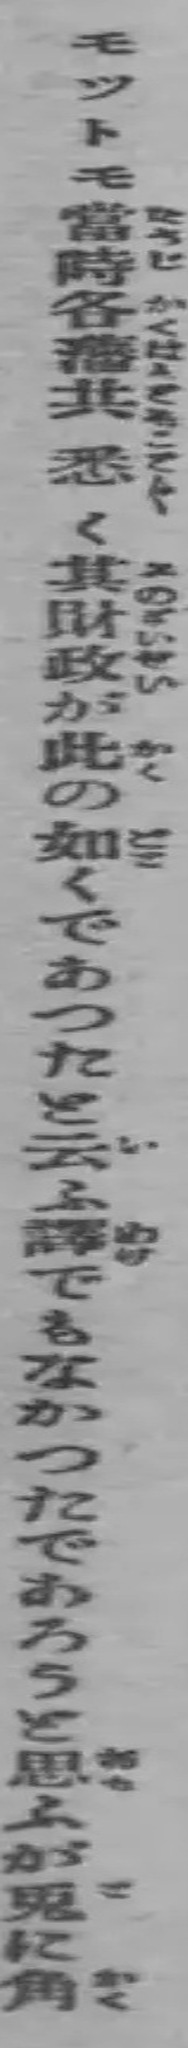モツトモ当時各藩共悉く其財政が此の如くであつたと云ふ訳でもなかつたであろうと思ふが兎に角

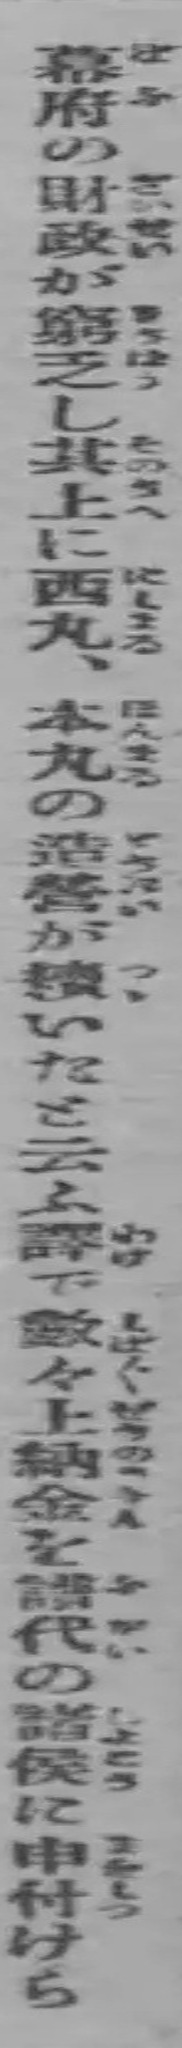幕府の財政が窮乏し其上に西丸、本丸の造営が続いたと云ふ訳で数々上納金を譜代の諸侯に申付けら
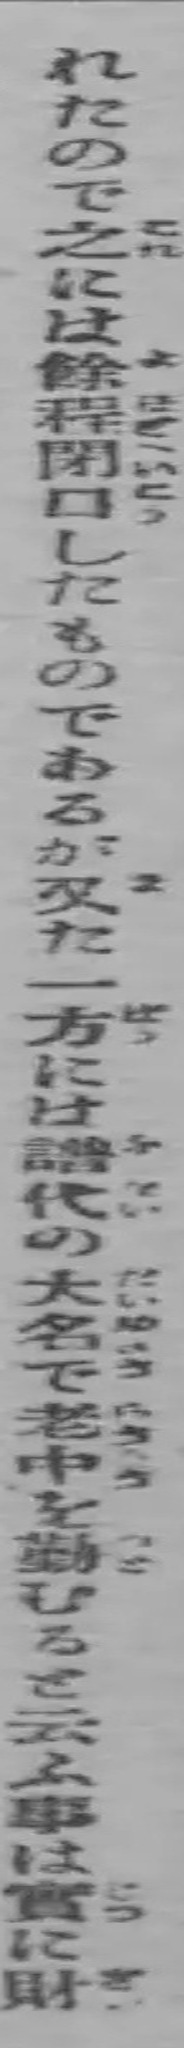れたので之には余程閉口したものであるが又た一方には譜代の大名で老中を勤むると云ふ事は実に財
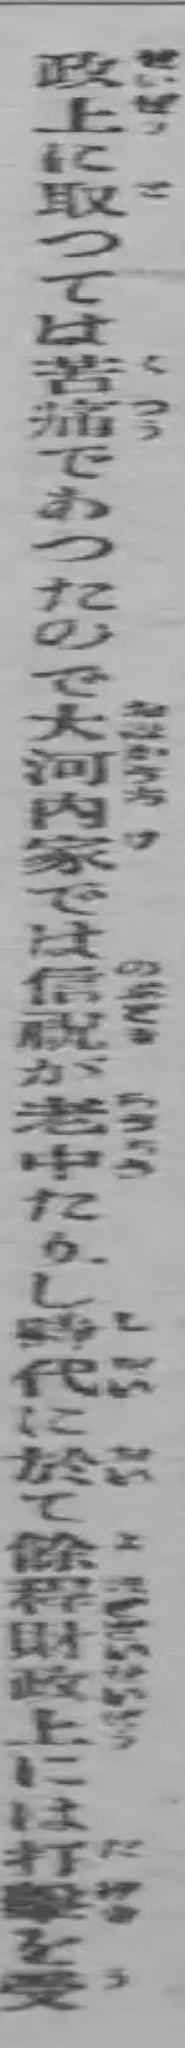政上に取つては苦痛であつたので大河内家では信祝が老中たりし時代に於て余程財政上には打撃を受
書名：豊橋市史談
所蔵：国立国会図書館 National Diet Library, JAPAN
